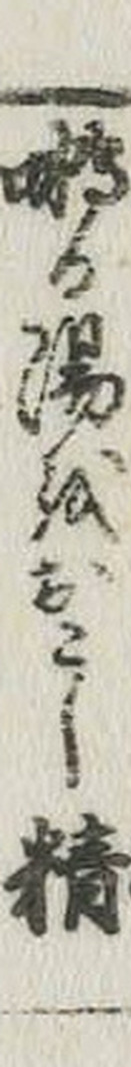囀る陽をおこし精
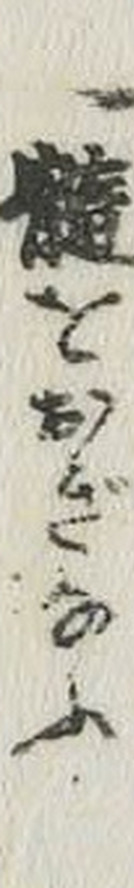髄をおぎなふ
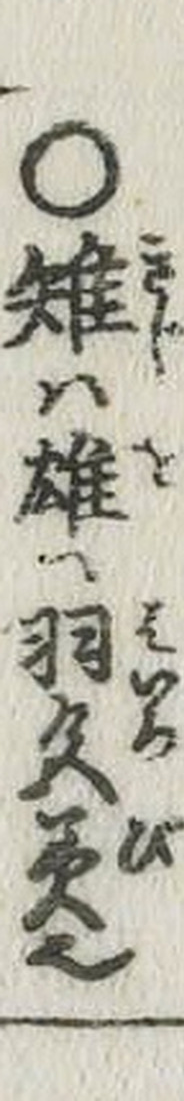○雉は雄は羽色美也
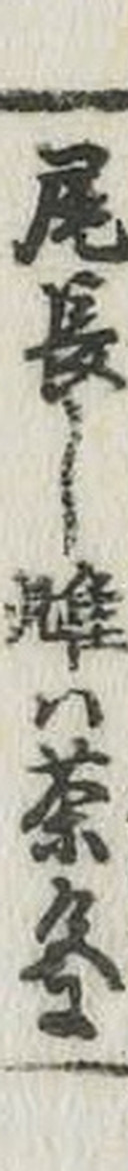尾長し雌は茶色に
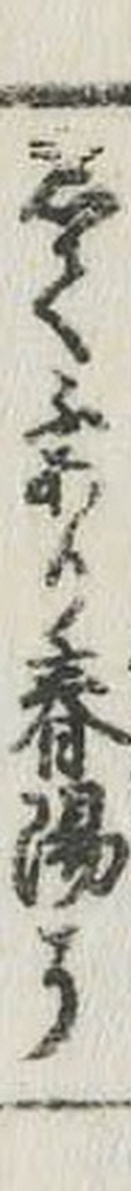してふあり春陽に
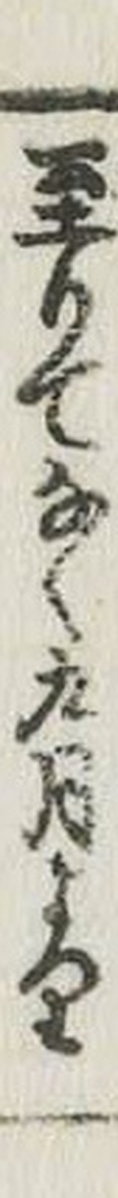至りてなく九月より
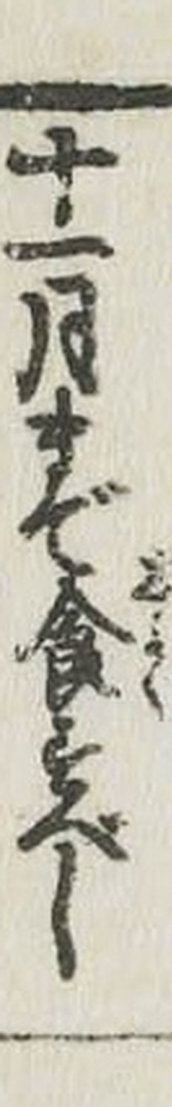十一月まで食すべし
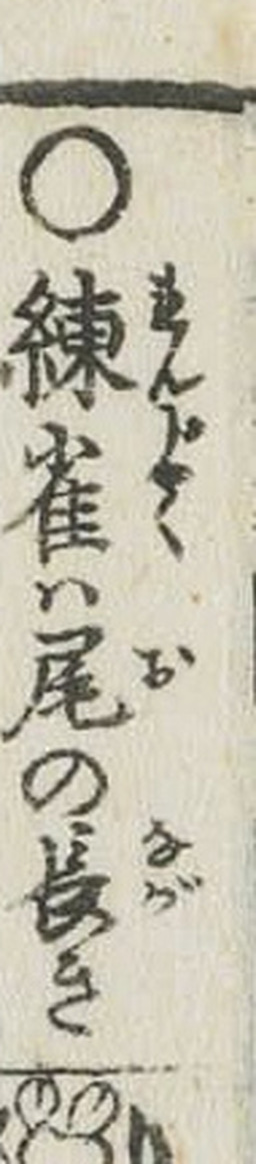○練雀は尾の長き
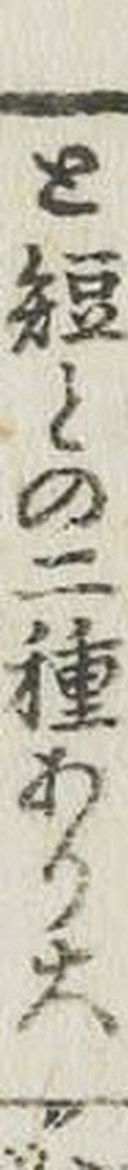と短との二種あり大
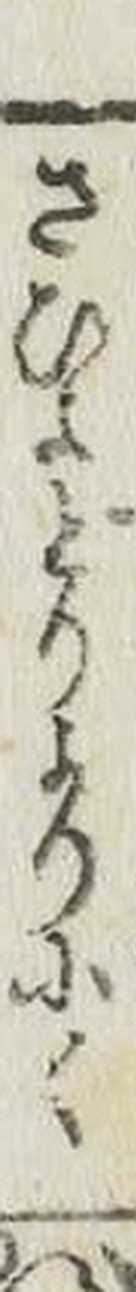さひよどりより小く
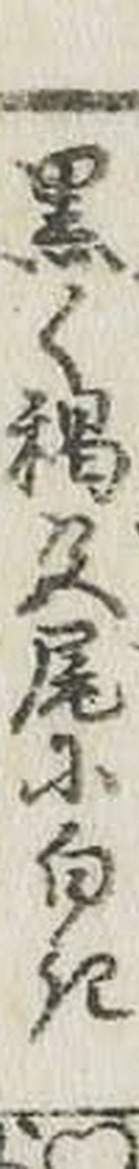黒く褐色尾に白き
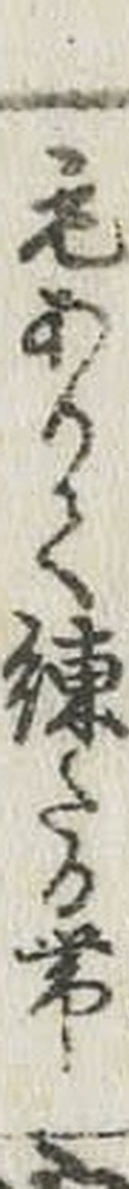毛ありて練たる帯
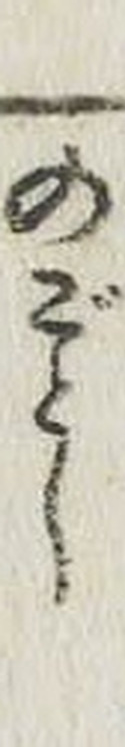のごとし
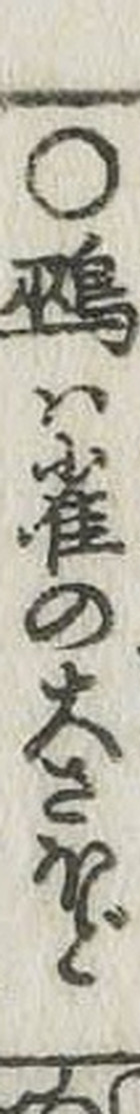○鵐は雀の大さほど
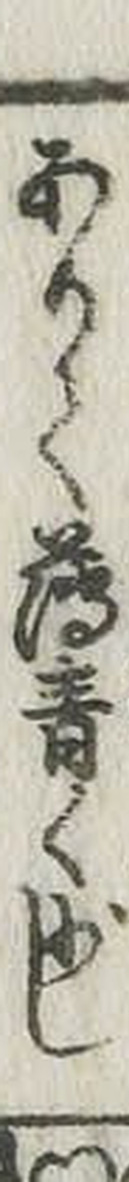ありて薄青く少し
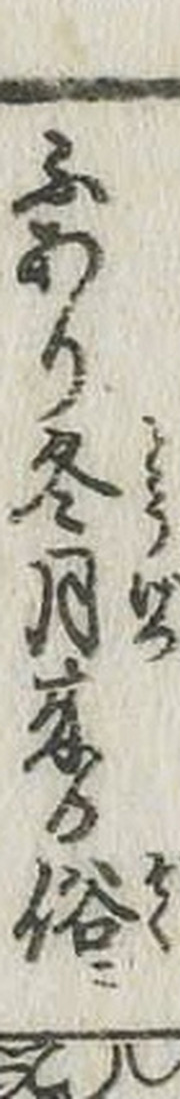ふあり冬月来る俗ニ
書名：増補頭書訓蒙図彙大成 10巻 6:巻之12-13
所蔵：東京学芸大学教育コンテンツアーカイブ
